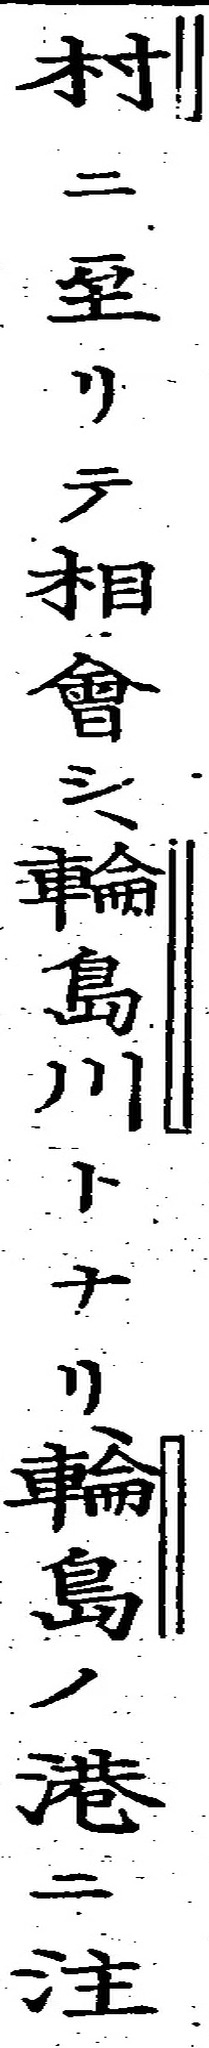村ニ至リテ相会シ、輪島川トナリ、輪島ノ港ニ注
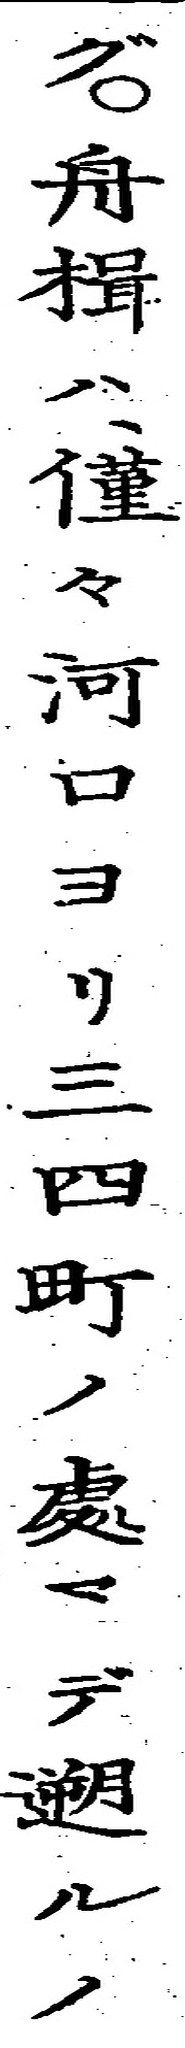グ。舟楫ハ、僅々河口ヨリ三四町ノ処マデ遡ルノ
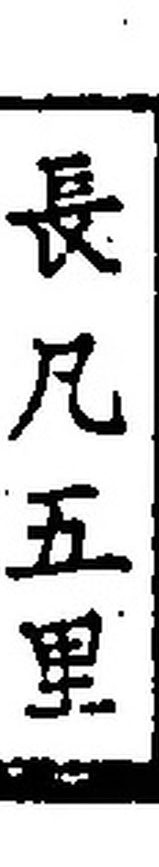長凡五里
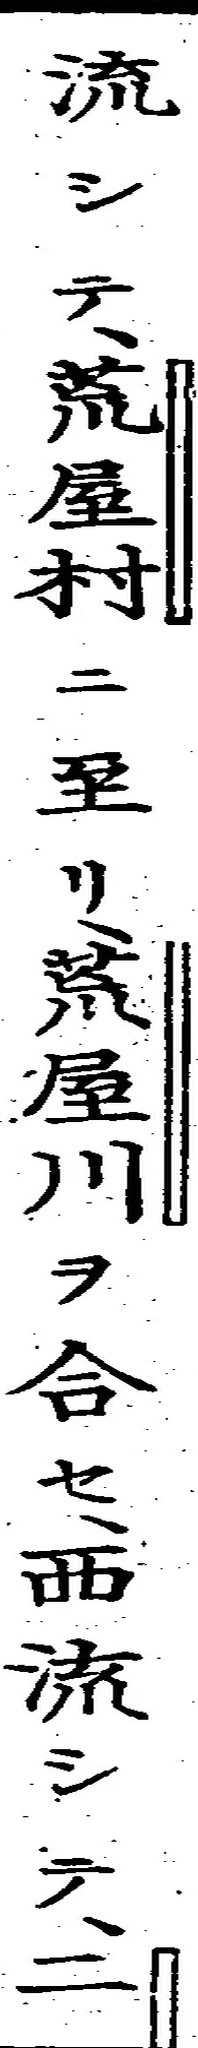流シテ、荒屋村ニ至リ、荒屋川ヲ合セ、西流シテ、二
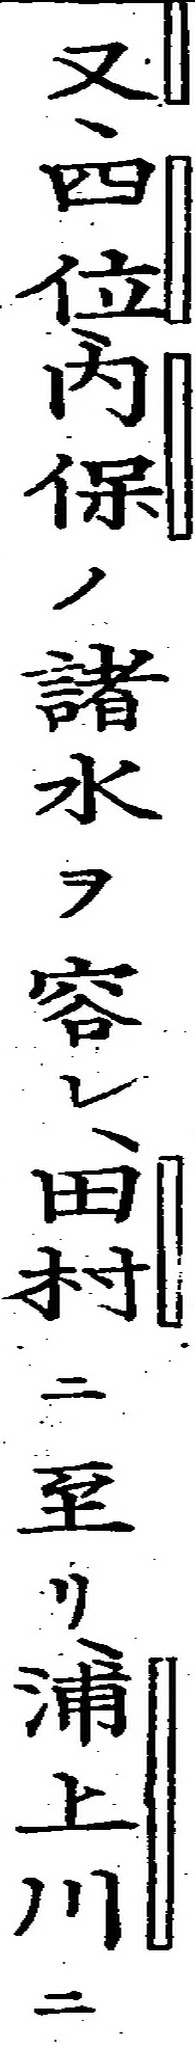又・四位・内保ノ諸水ヲ容レ、田村ニ至リ、浦上川ニ
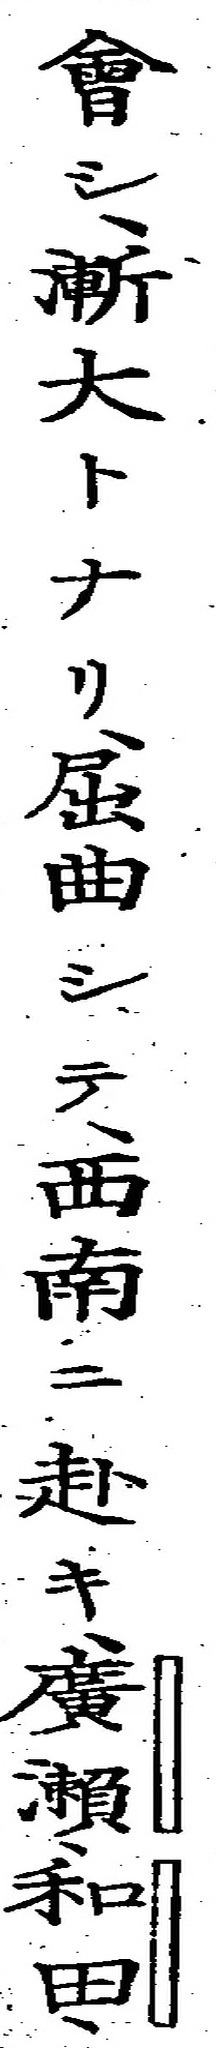会シ、漸大トナリ、屈曲シテ、西南ニ赴キ、広瀬・和田・
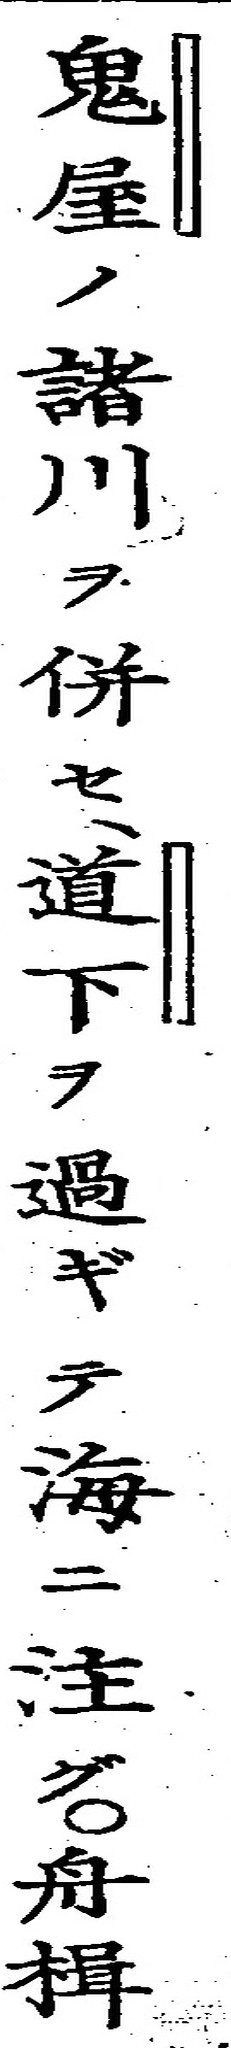鬼屋ノ諸川ヲ併セ、道下ヲ過ギテ海ニ注グ。舟楫

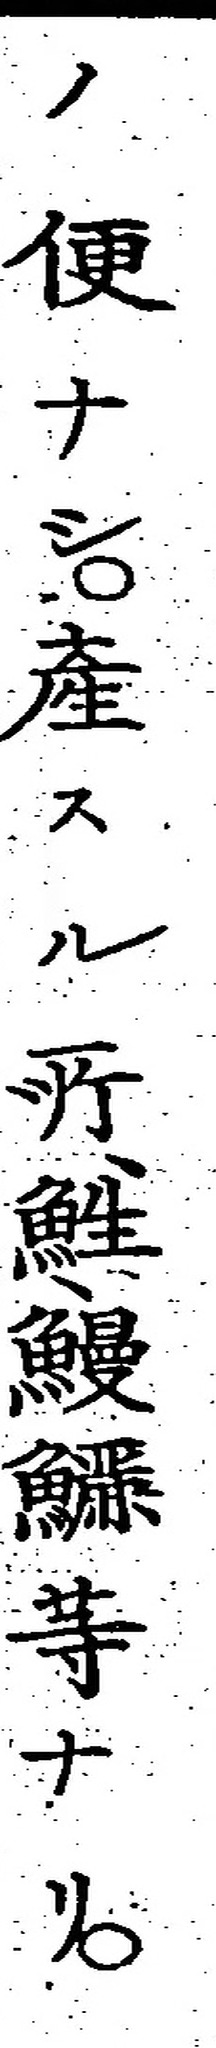ノ便ナシ。産スル所、鮏・鰻鱺等ナリ。
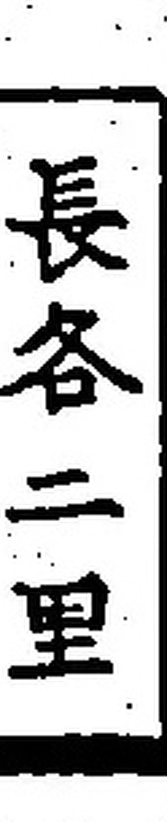長各二里
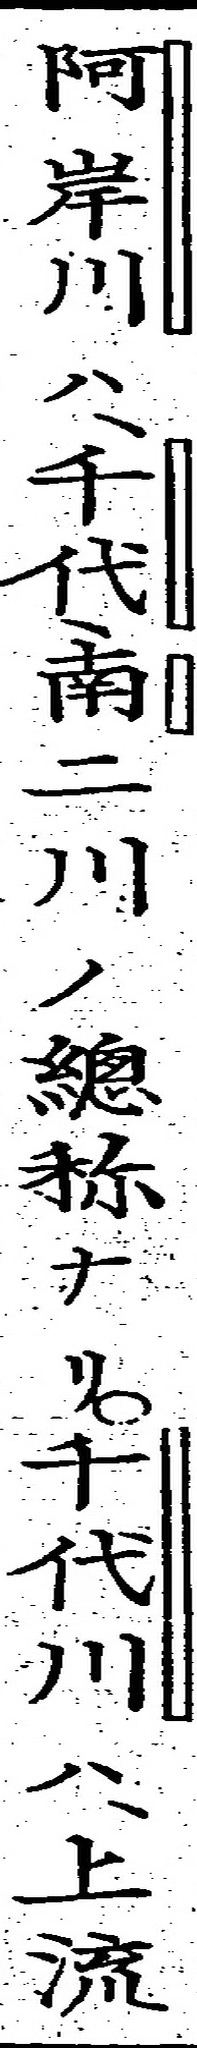阿岸川ハ、千代・南二川ノ総称ナリ。千代川ハ、上流
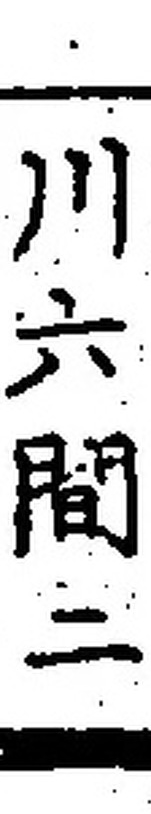川六間二
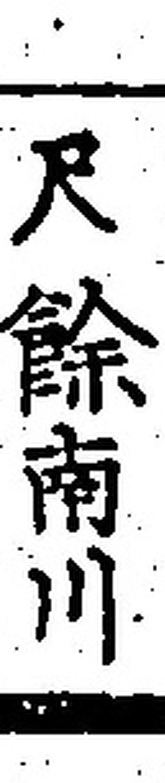尺余南川
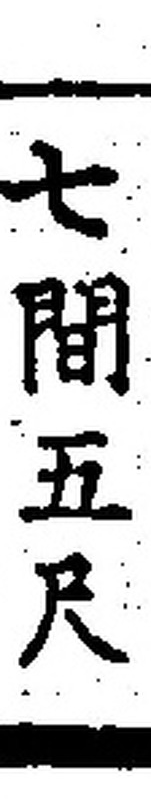七間五尺
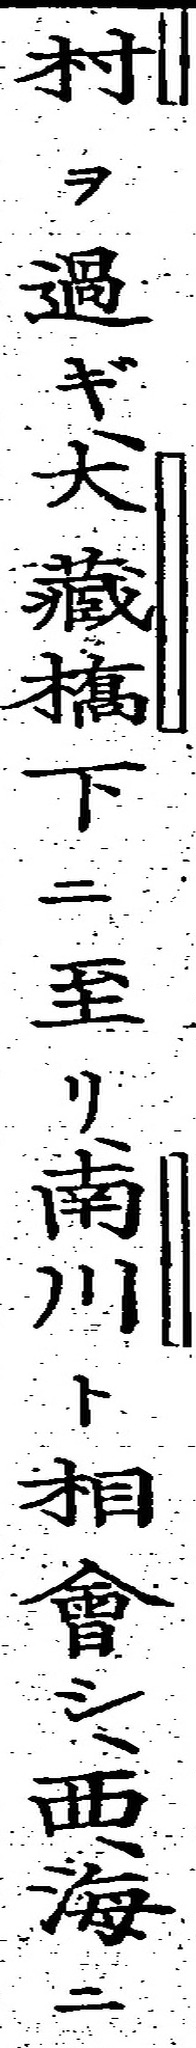村ヲ過ギ、大蔵橋下ニ至リ、南川ト相会シ、西、海ニ
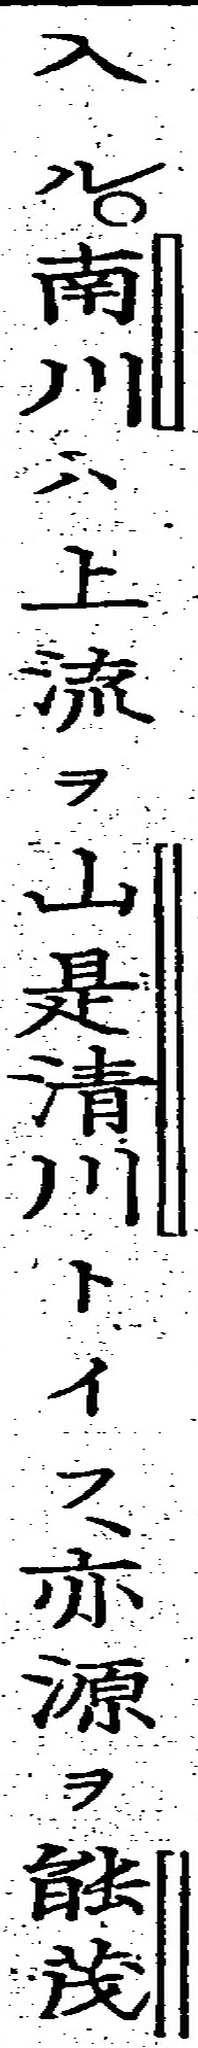入ル。南川ハ上流ヲ山是清川トイフ、亦源ヲ能茂
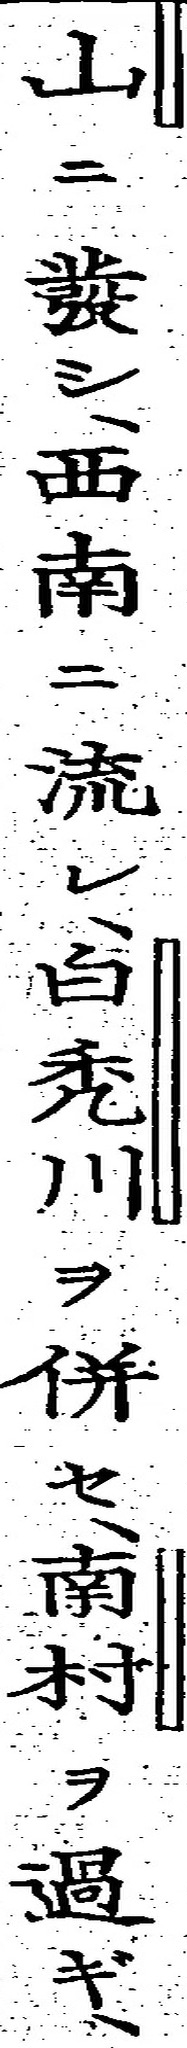山ニ発シ、西南ニ流レ、白禿川ヲ併セ、南村ヲ過ギ、
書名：能登地誌略
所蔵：国立国会図書館 National Diet Library, JAPAN
